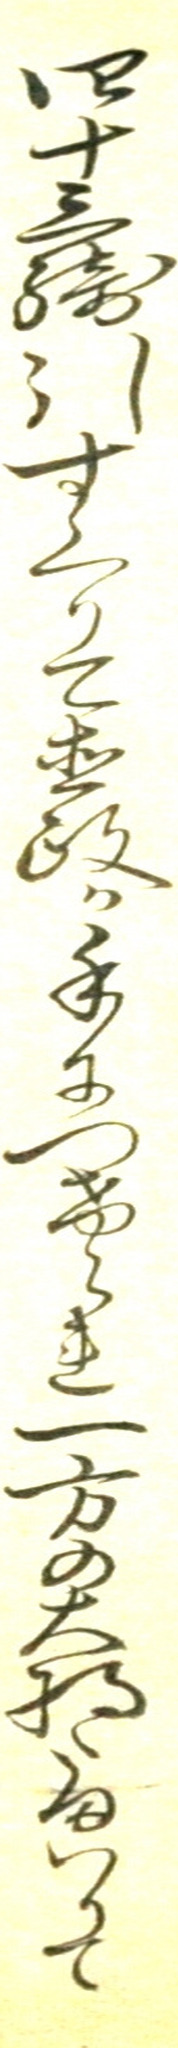四十三騎引すくりて直政か手につけられ一方の大将たまはりて
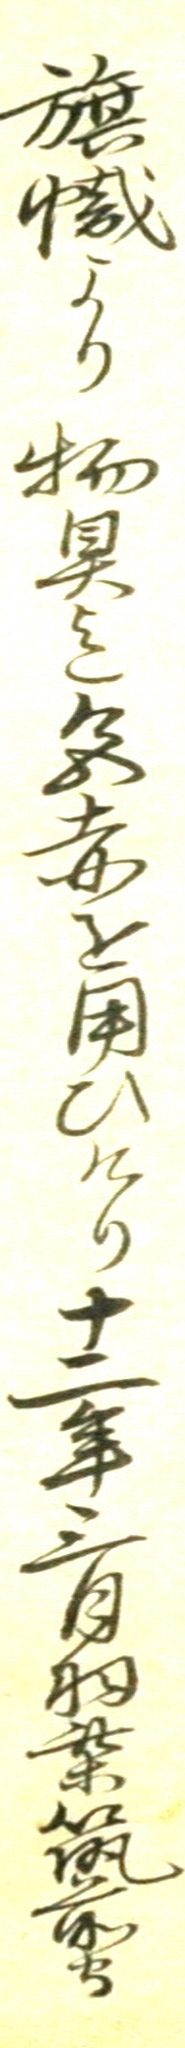旗幟より物具迄色赤を用ひけり十二年三月羽柴筑前守
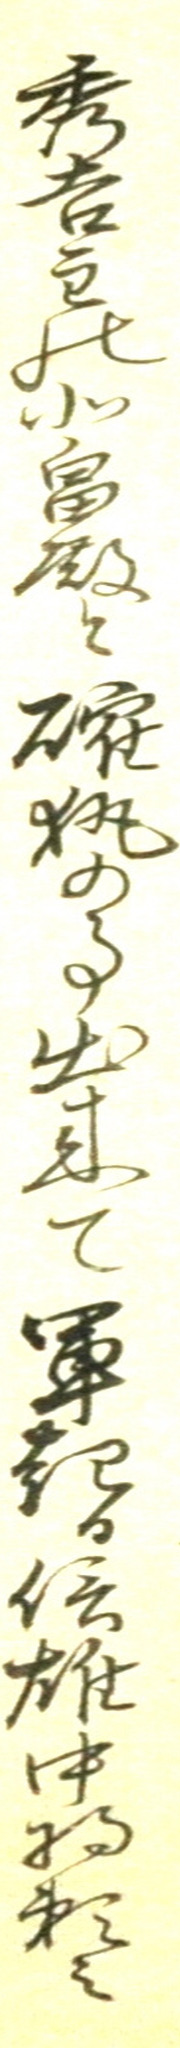秀吉主の北畠殿と確執の事出来て軍起る信雄中将頼み
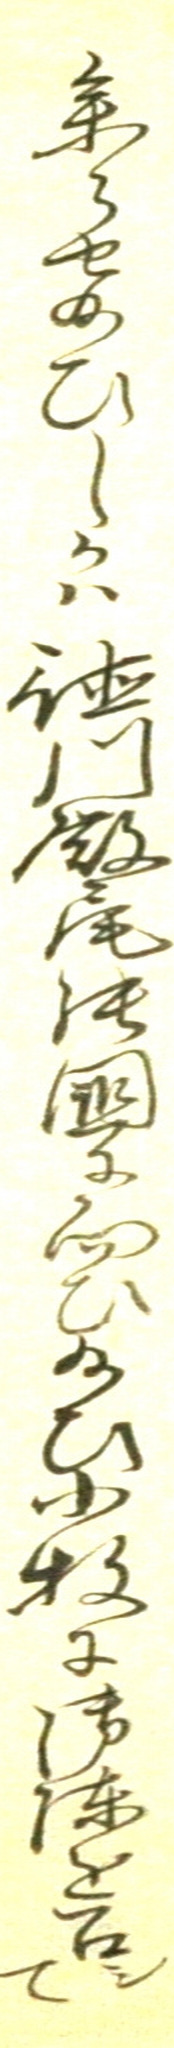参らせ給ひしかは徳川殿尾張国に向ひ給ひ小牧に御陣を召シて
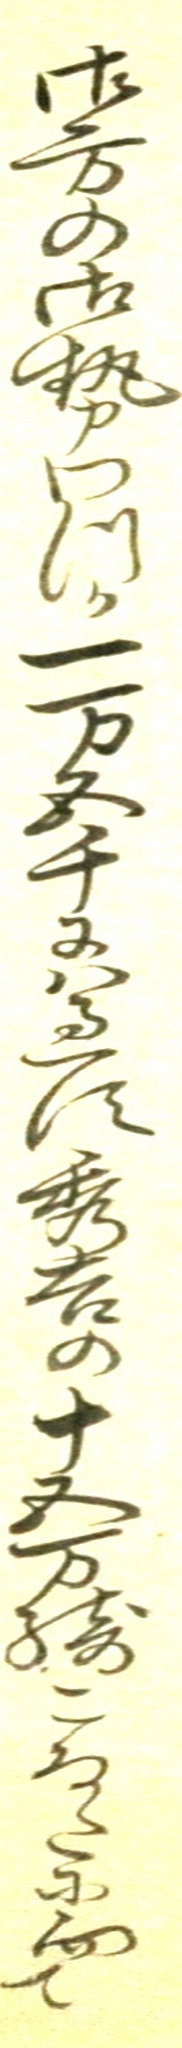御方の御勢わつか一万五千には過す秀吉の十五万騎こなたに向て
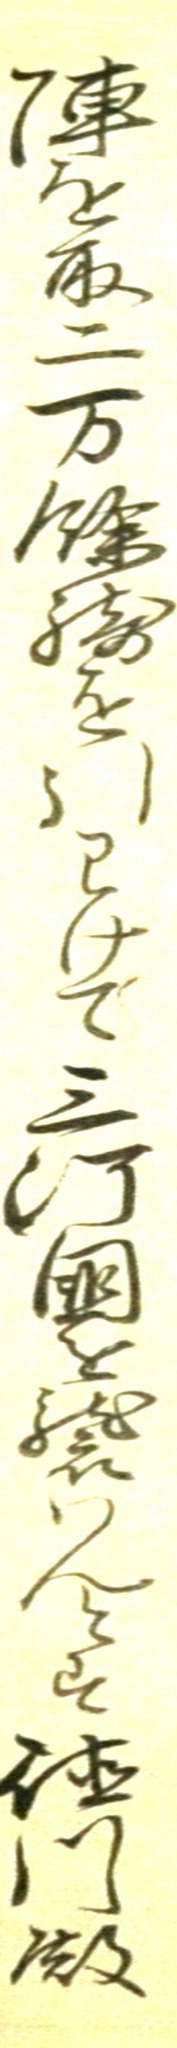陣を取二万余騎を引わけて三河国を襲わんとす徳川殿
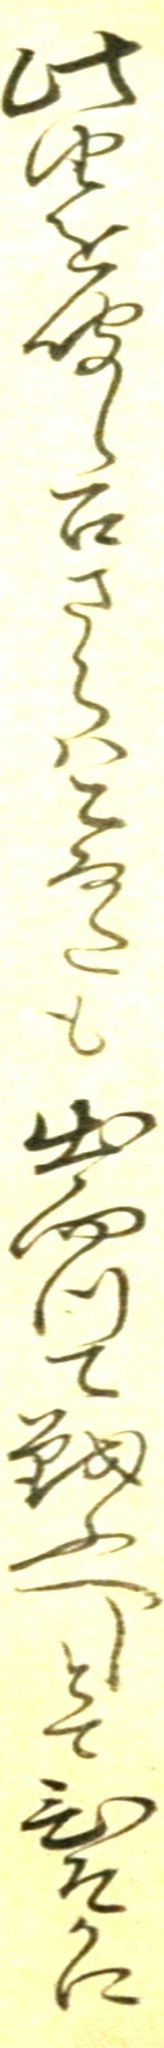此由を聞し召さらはこなたも出向つて戦ふへしとてひそかに
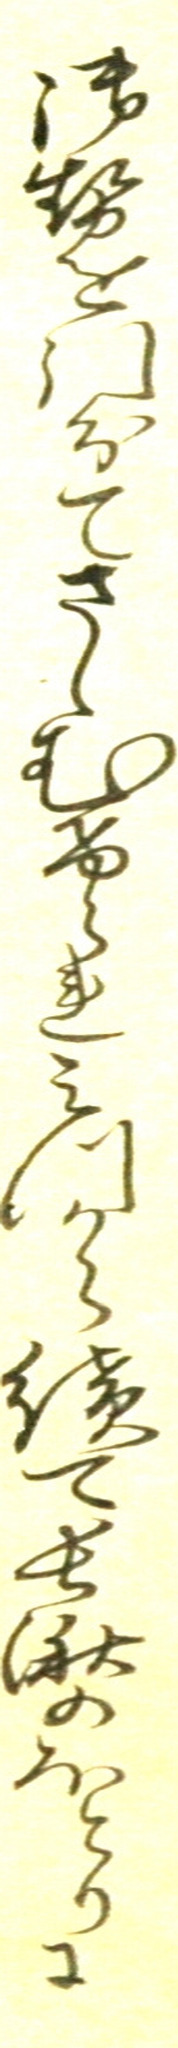御勢を引分てさしむけられみつから続て長湫のほとりに

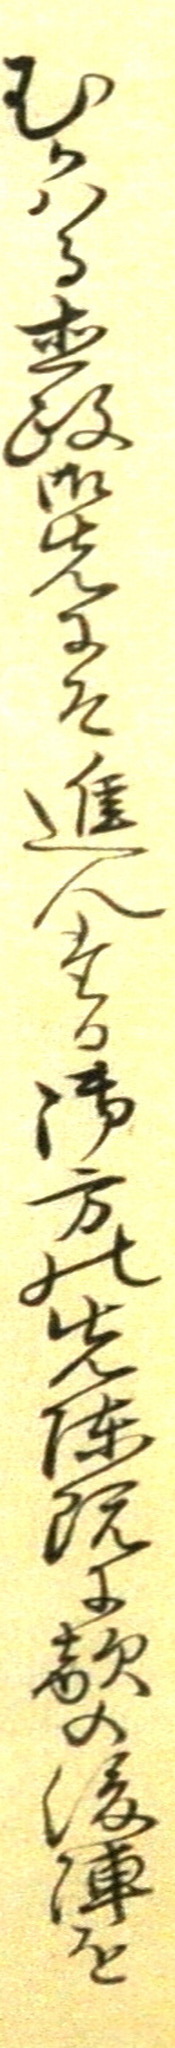むかはる直政御先にそ進んたる御方の先陣既に敵の後陣を
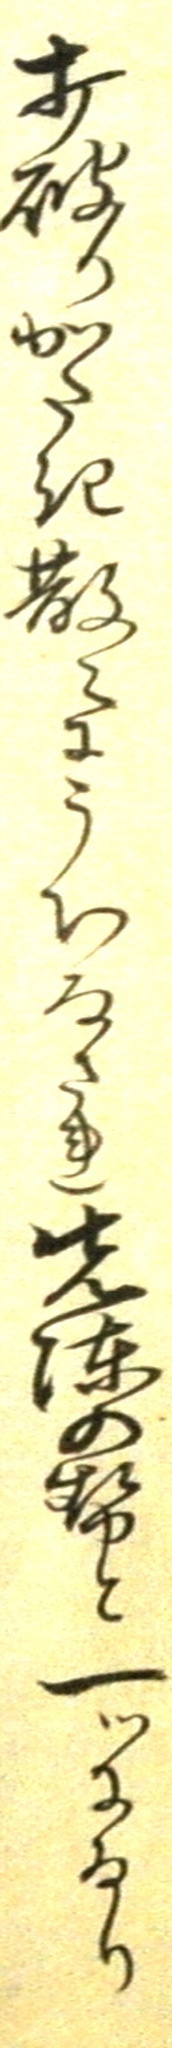打破りかたき散々にうちなたれ先陣の勢と一ッになり
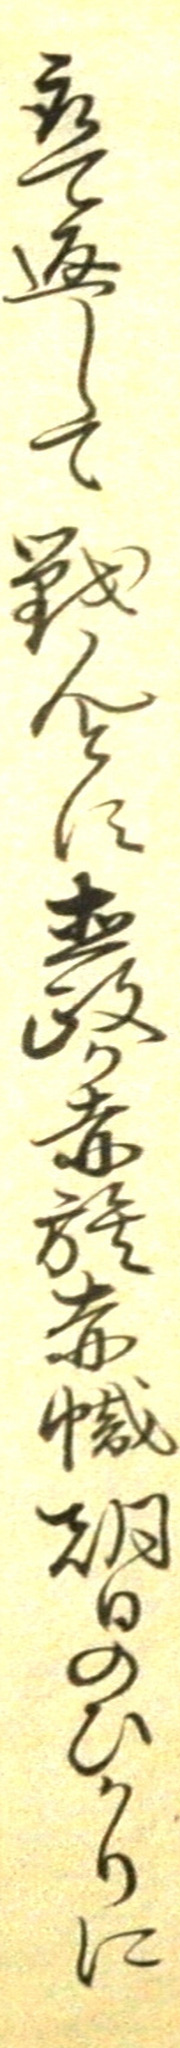取て返して戦んとす直政か赤旗赤幟朝日のひかりに
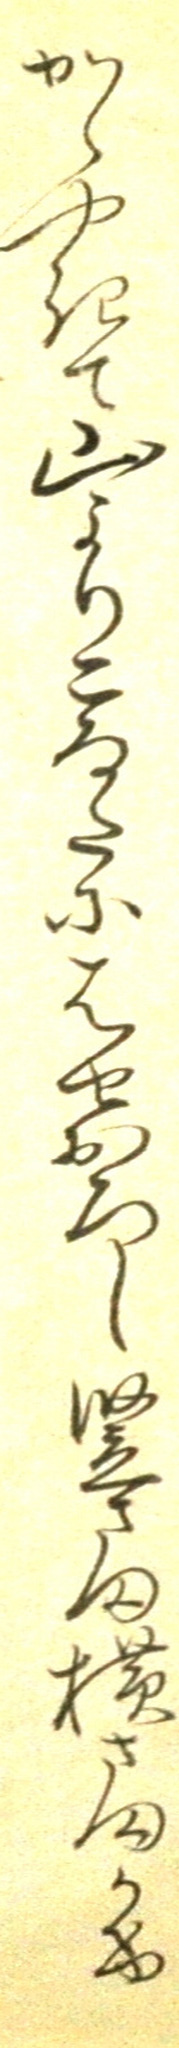かゝやきて山よりこなたにはせおろし竪さま横さまかけ
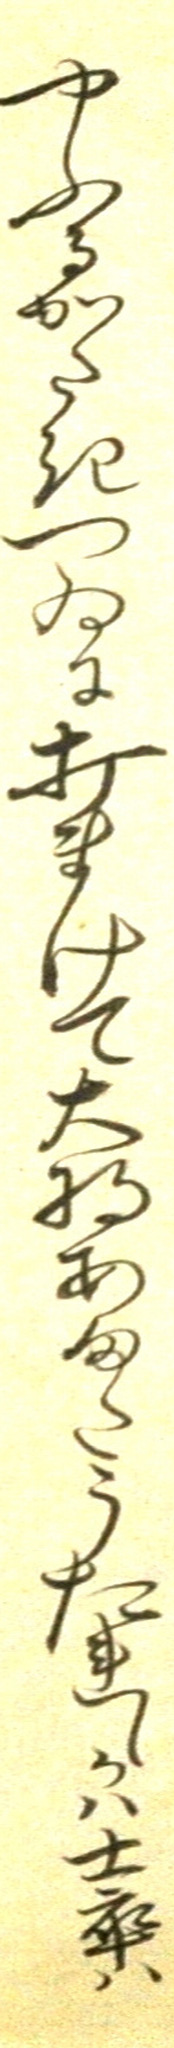やふるかたきつゐに打まけて大将あまたうたれしかは士卒は
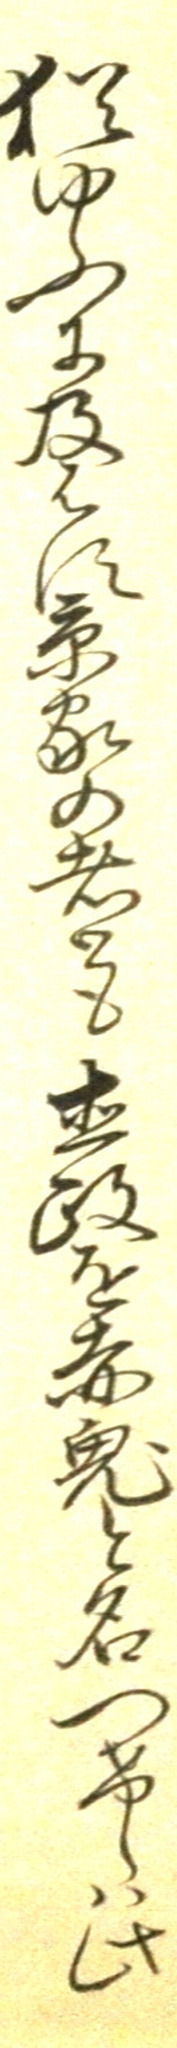猶ゆふに及はす京家の者とも直政を赤鬼と名つけしは此
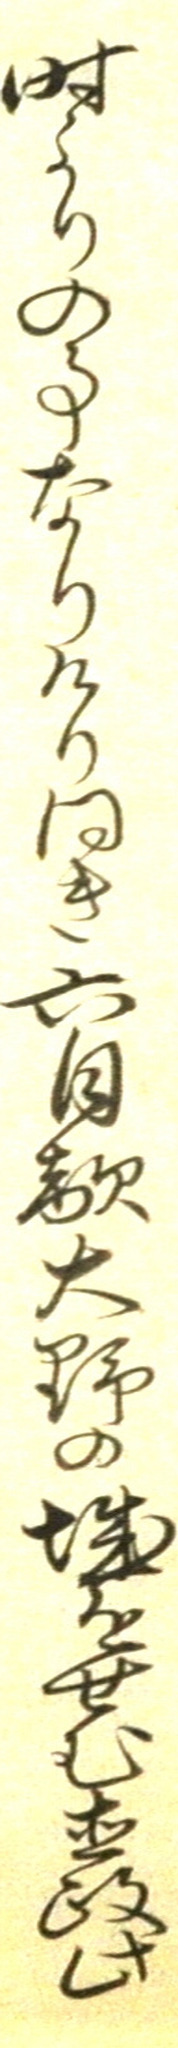時よりの事なりけり同き六月敵大野の城をせむ直政此
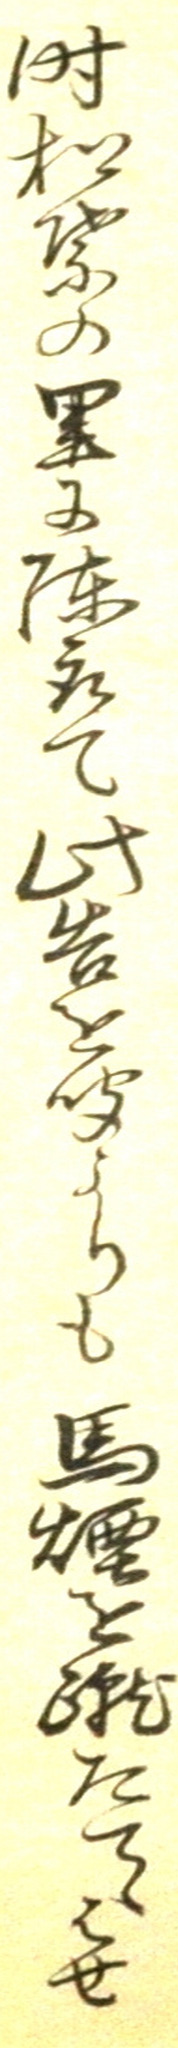時松葉の里に陣取て此告を聞よりも馬煙を蹴たてゝはせ
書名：藩翰譜（四・上）
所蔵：伊那市立高遠町図書館・合同会社AMANE
